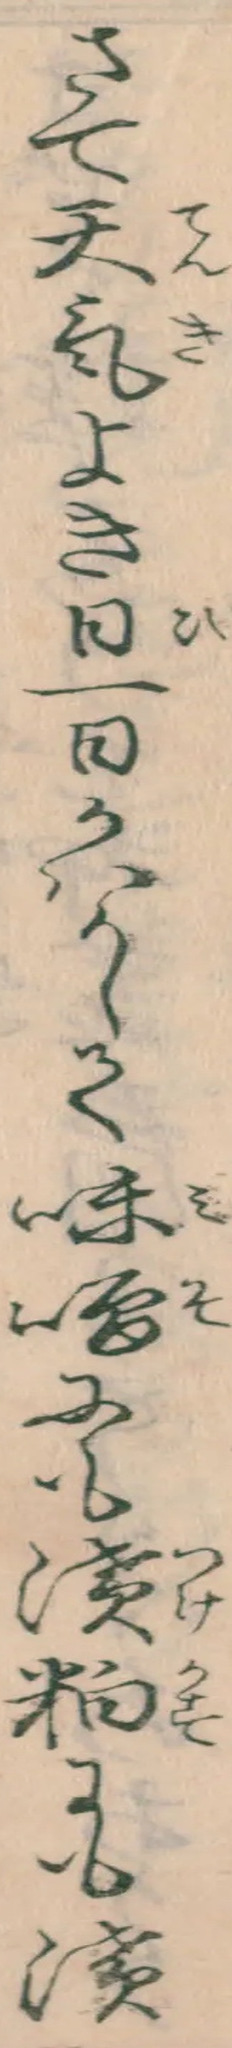さて天気よき日一日かはかして味噌にも漬粕にも漬
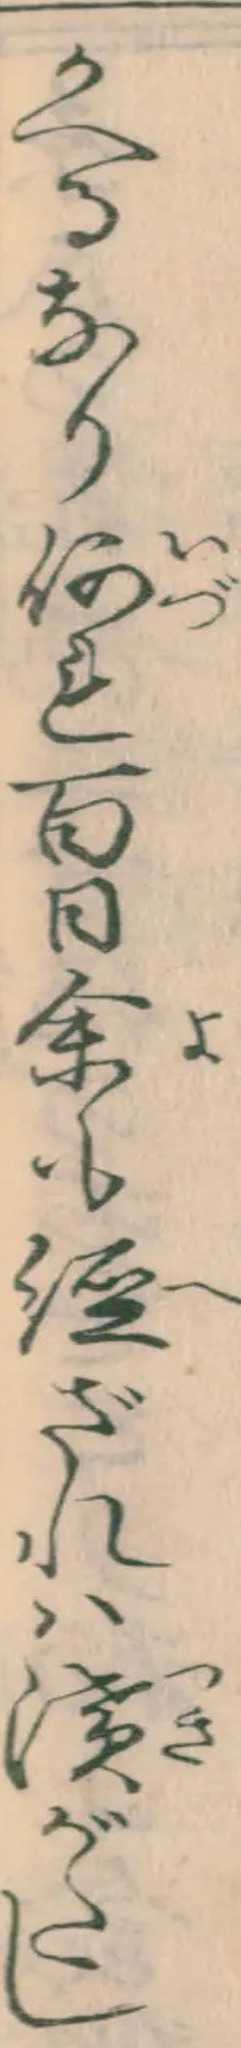かへるなり何れ百日余も経ざれは漬がたし
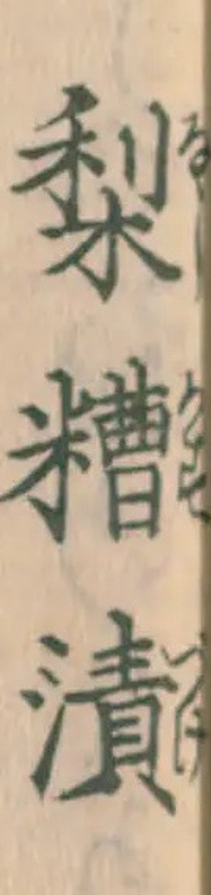梨糟漬
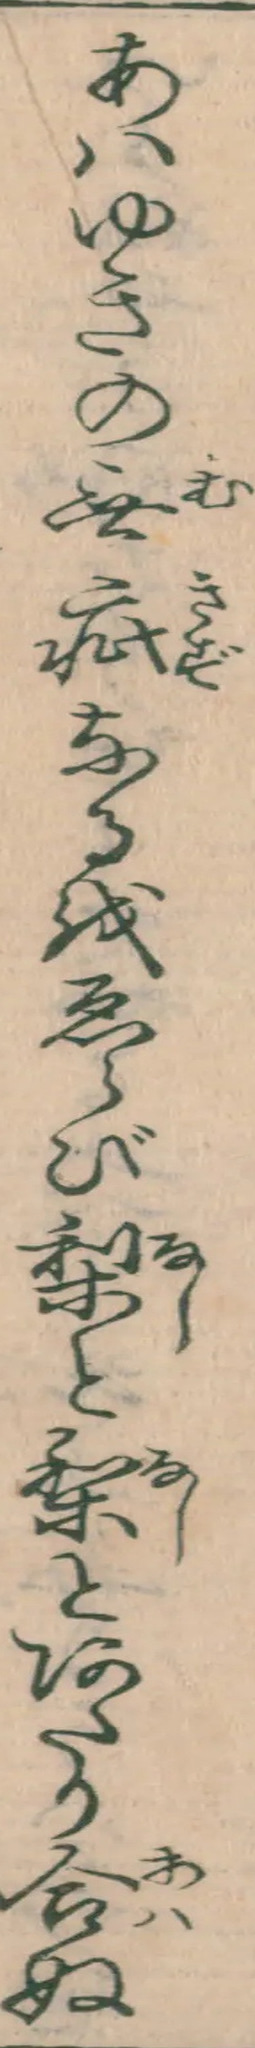あはゆきの無疵なるをゑらび梨と梨とあたり合ぬ
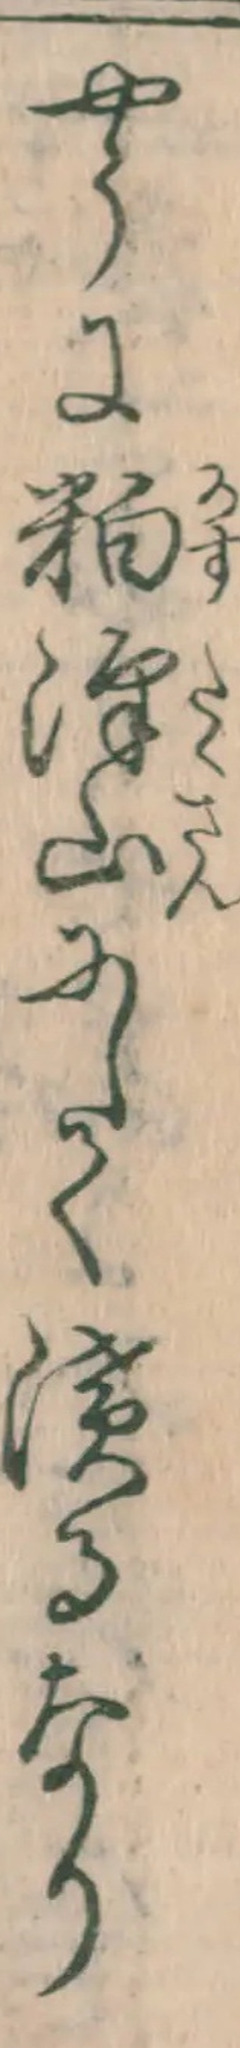やうに粕沢山にして漬るなり
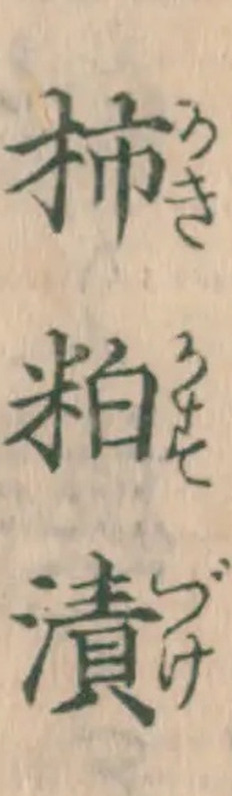柿粕漬
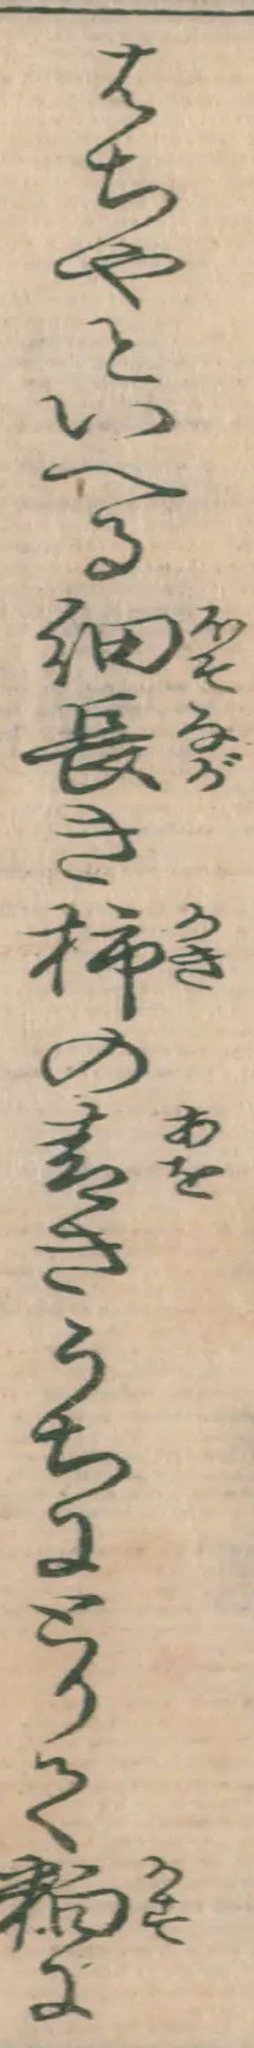はちやといへる細長き柿の青きうちにとりて粕に
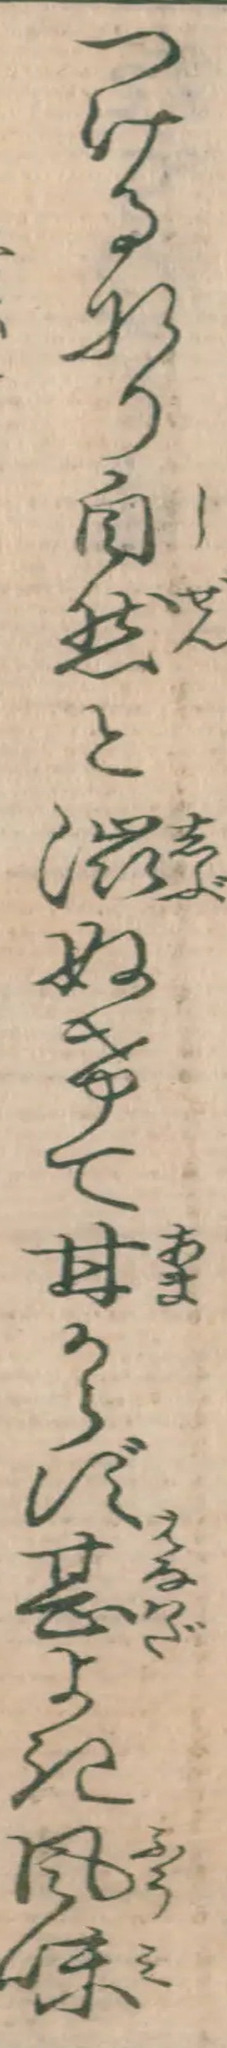つけるなり自然と渋ぬけて甘からず甚よき風味
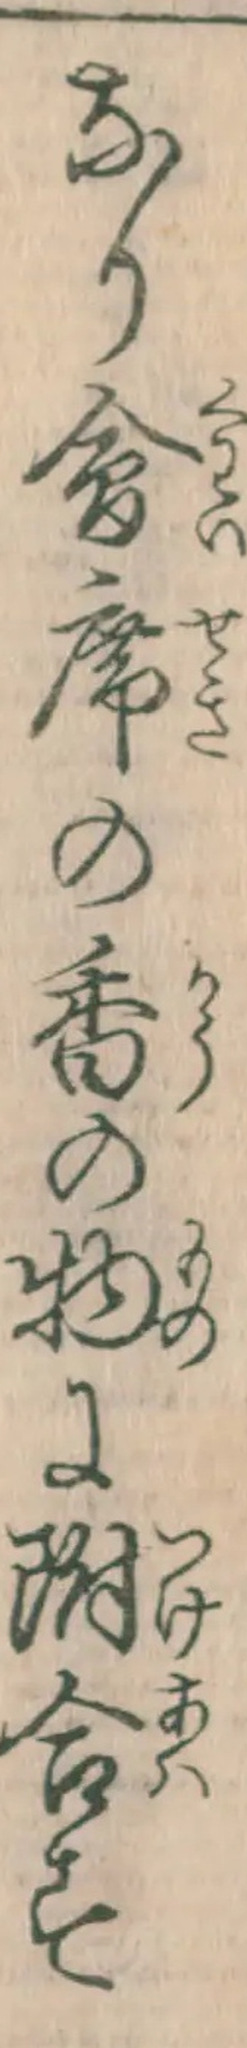なり会席の香の物に附合す
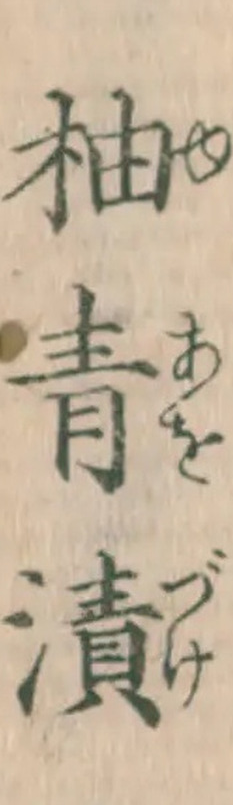柚青漬
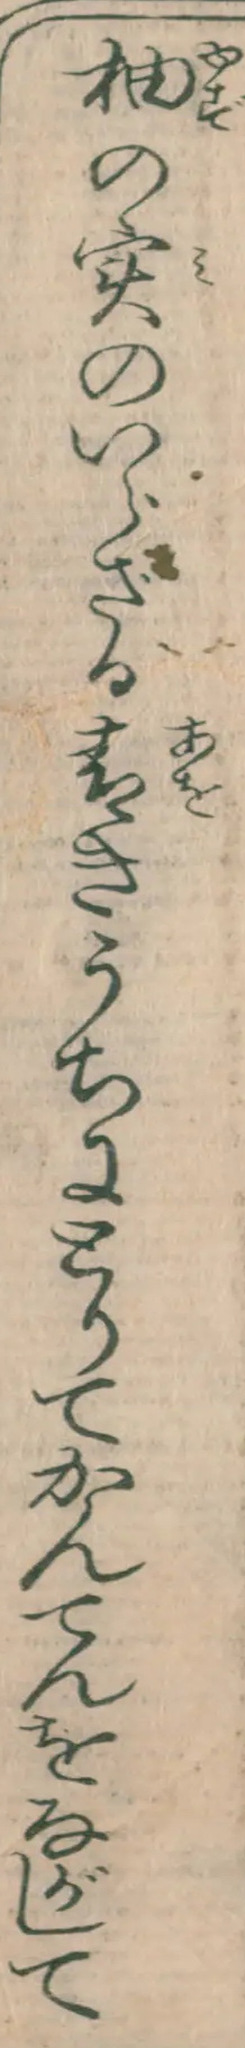柚の実のいらざる青きうちにとりてかんてんをながして

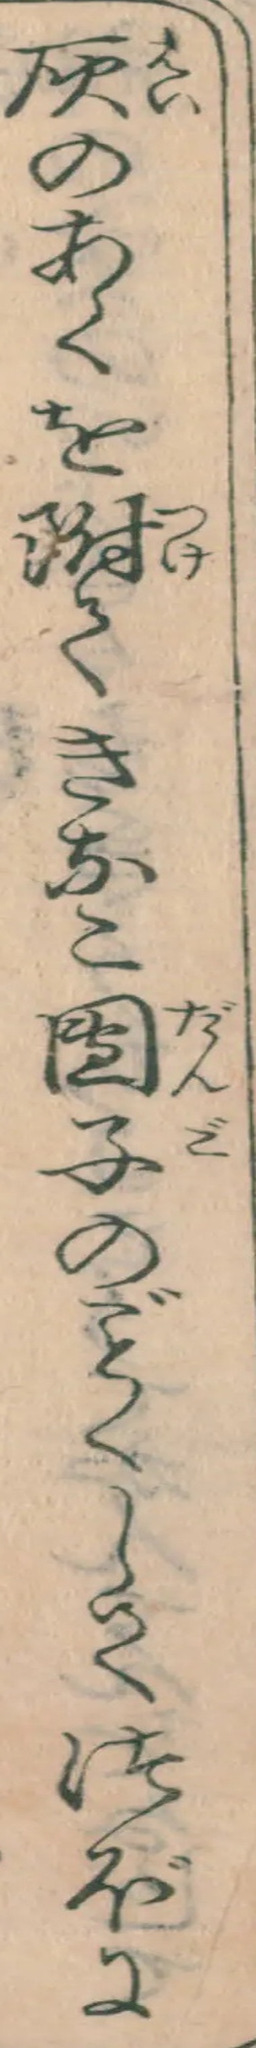灰のあくを附てきなこ団子のごとくしてつぼに
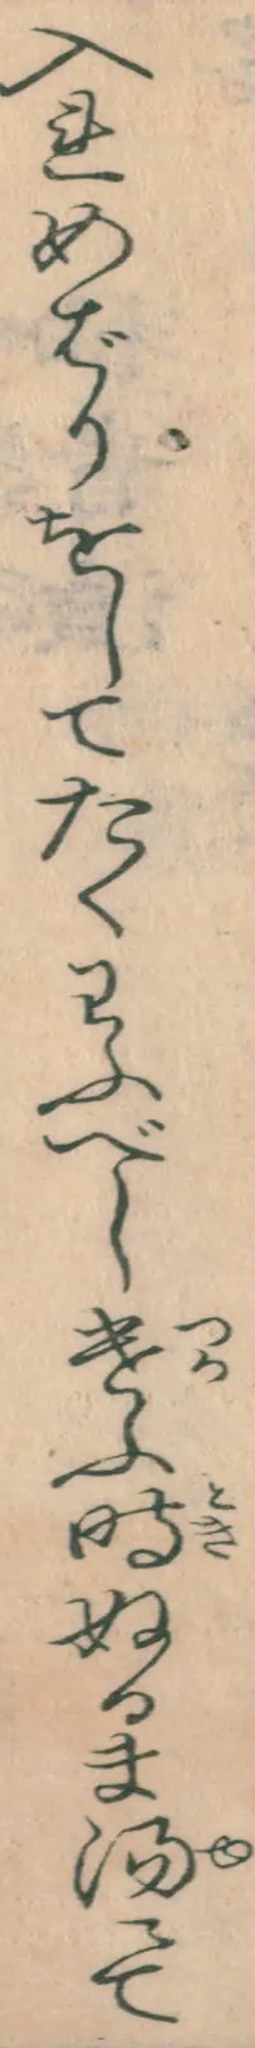入れめばりをしてたくわふべし遣ふ時ぬるま湯にて
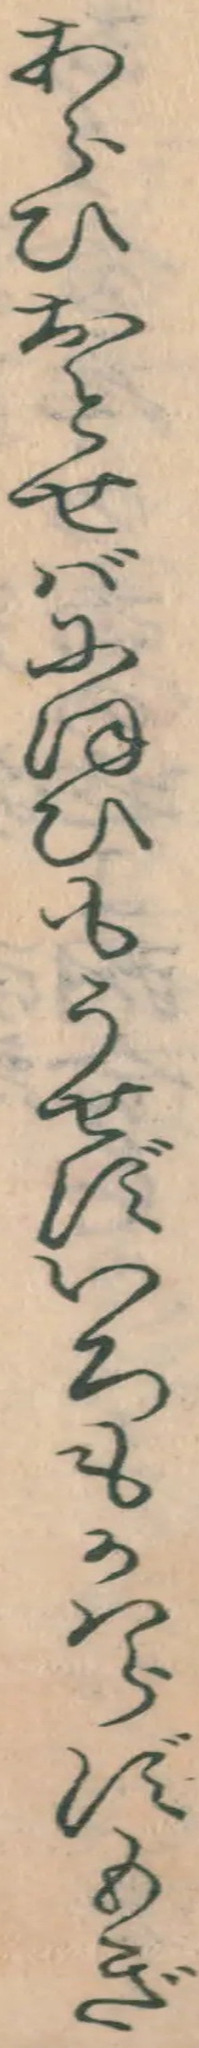あらひおとせばにほひもうせずいろもかはらずもぎ
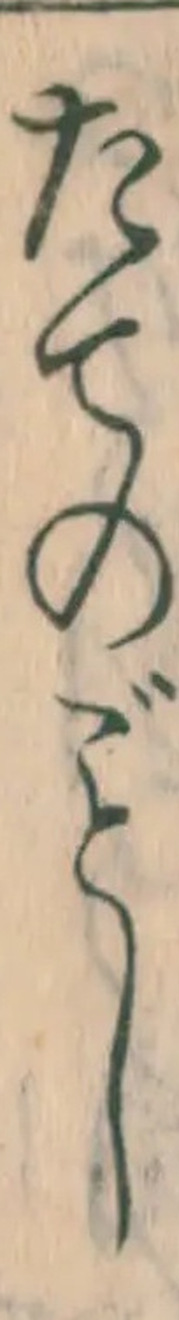たてのごとし
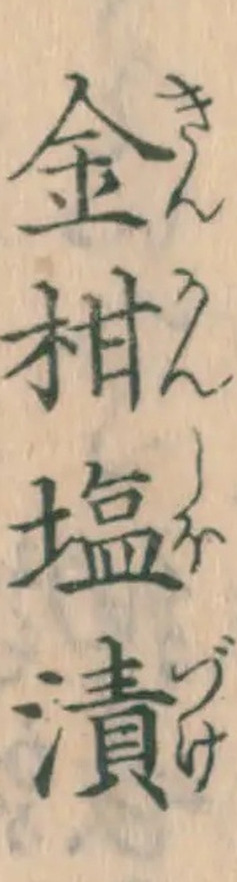金柑塩漬
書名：四季漬物鹽嘉言
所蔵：国立国会図書館 National Diet Library, JAPAN
